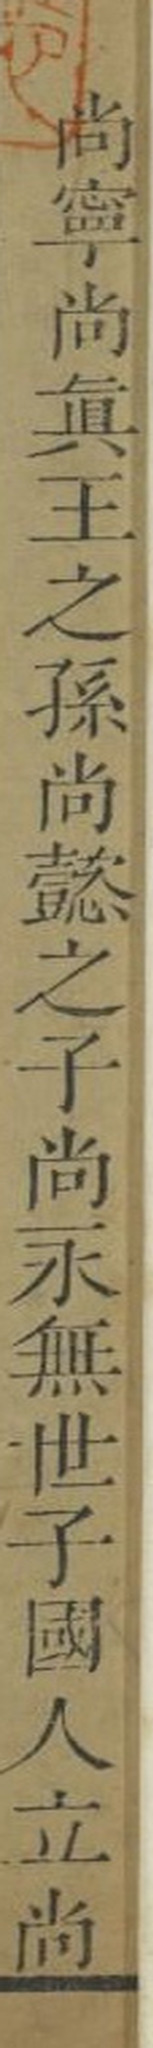尚寧尚真王之孫尚懿之子尚永無世子国人立尚
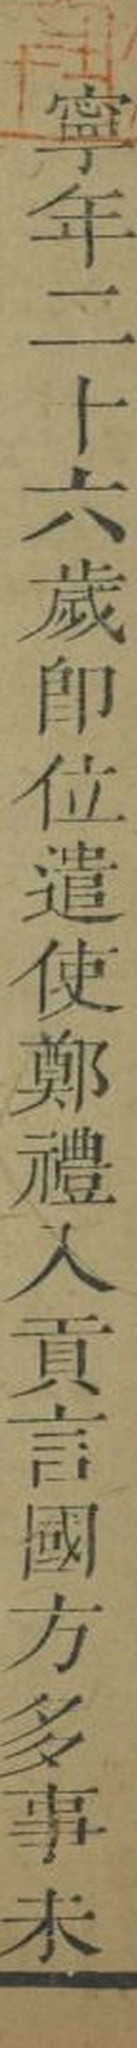寧年二十六歳即位遣使鄭礼入貢言国方多事未
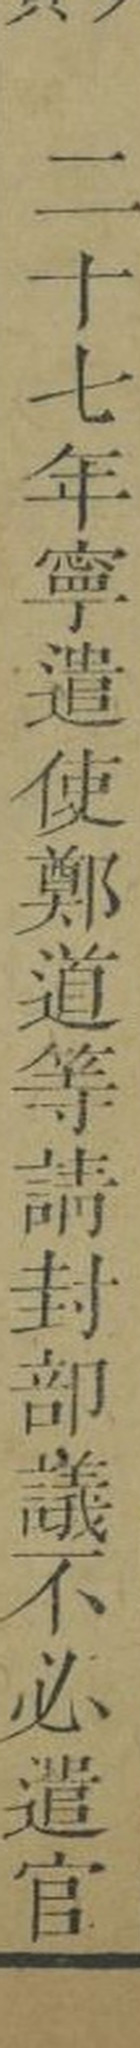入貢二十七年寧遣使鄭道等請封部議不必遣官
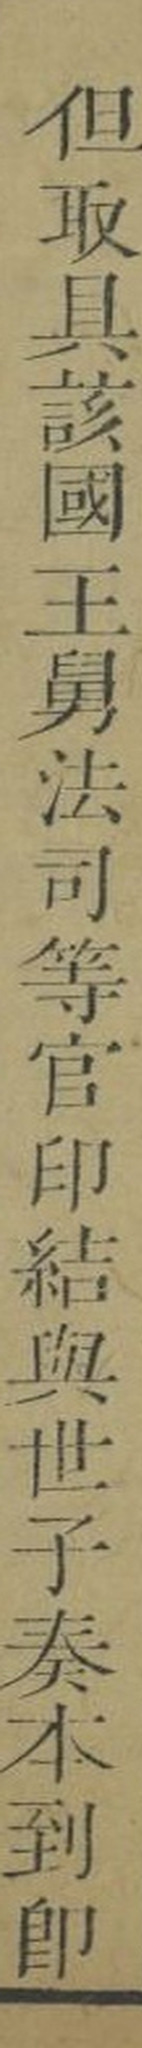但取具該国王舅法司等官印結与世子奏本到即
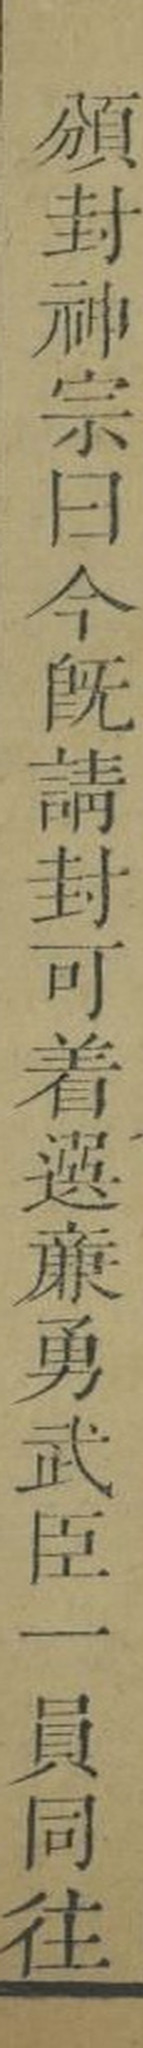頒封神宗曰今既請封可着選廉勇武臣一員同往
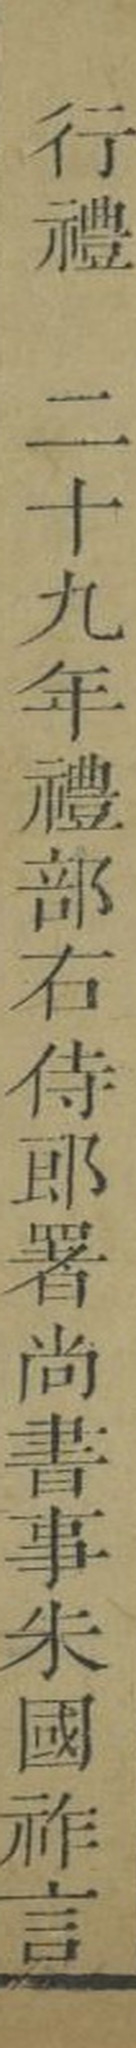行礼二十九年礼部右侍郎署尚書事朱国祚言
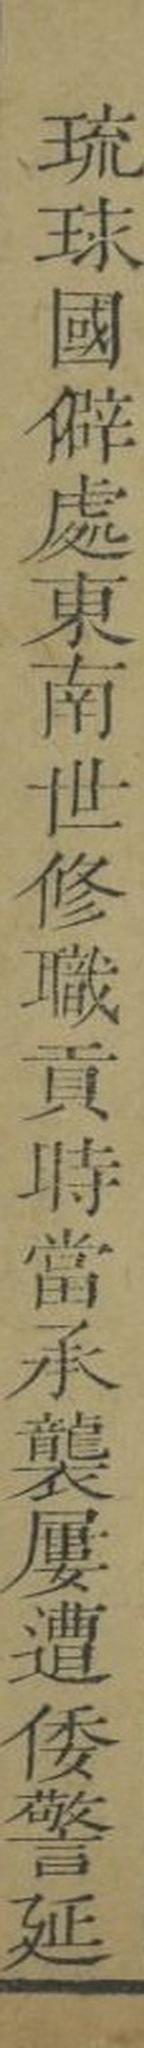琉球国僻処東南世修職貢時当承襲屢遭倭警延
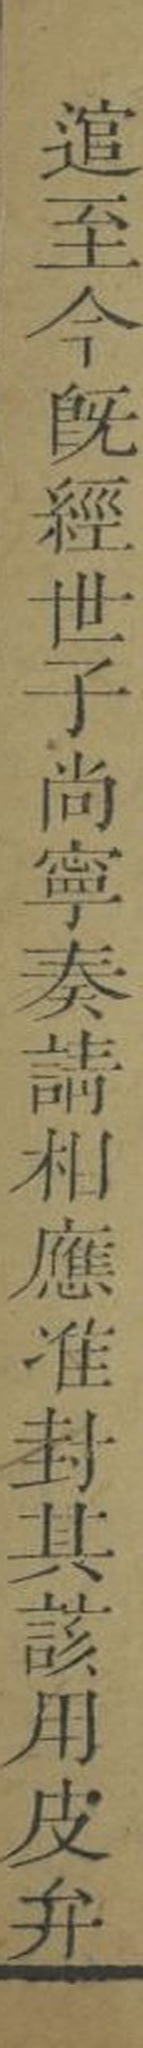逭至今既経世子尚寧奏請相応准封其該用皮弁

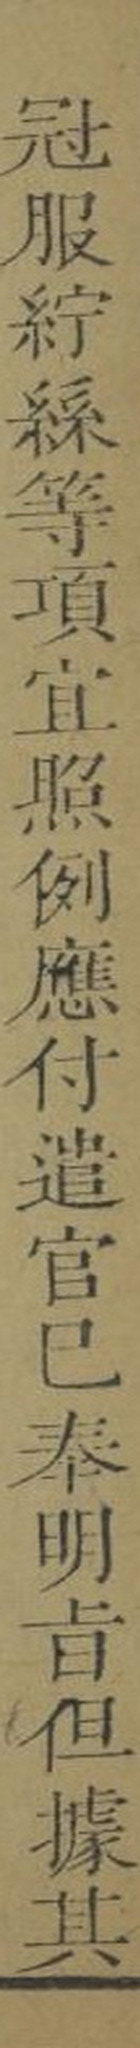冠服紵糸等項宜照例応付遣官巳奉明旨但拠其
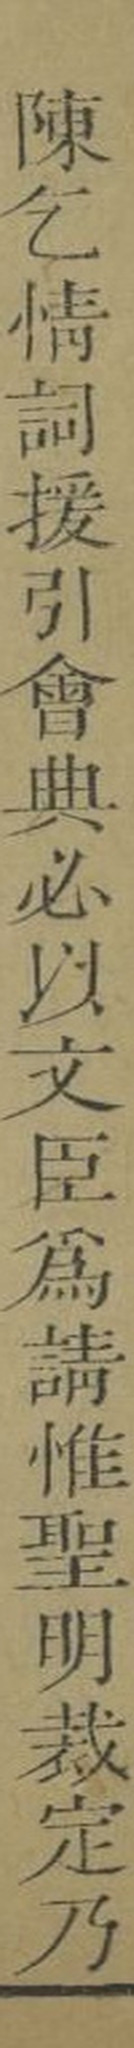陳乞情詞援引会典必以文臣為請惟聖明裁定乃
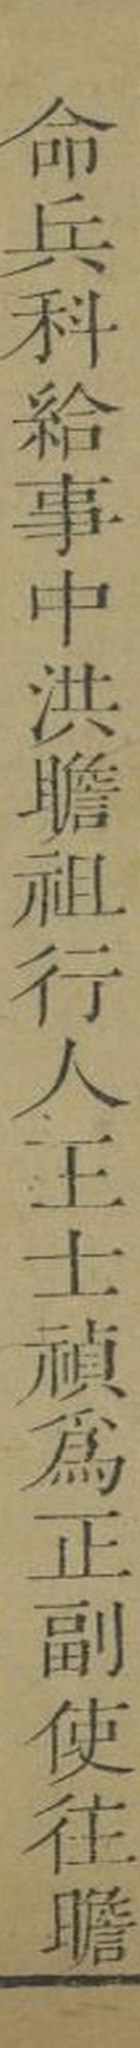命兵科給事中洪瞻祖行人王士禎為正副使往瞻
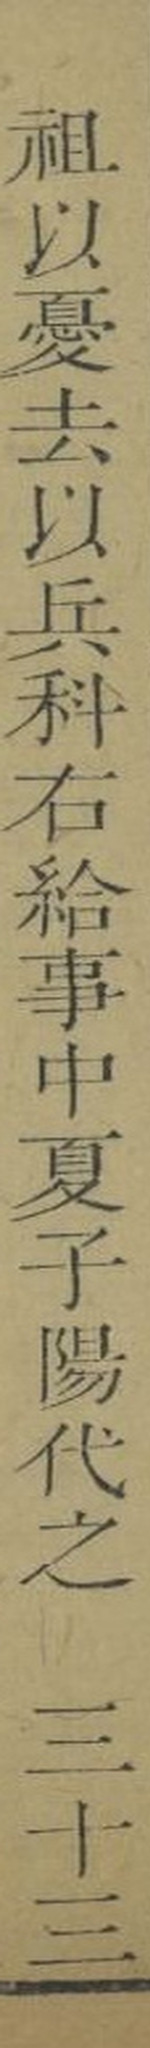祖以憂去以兵科右給事中夏子陽代之三十三
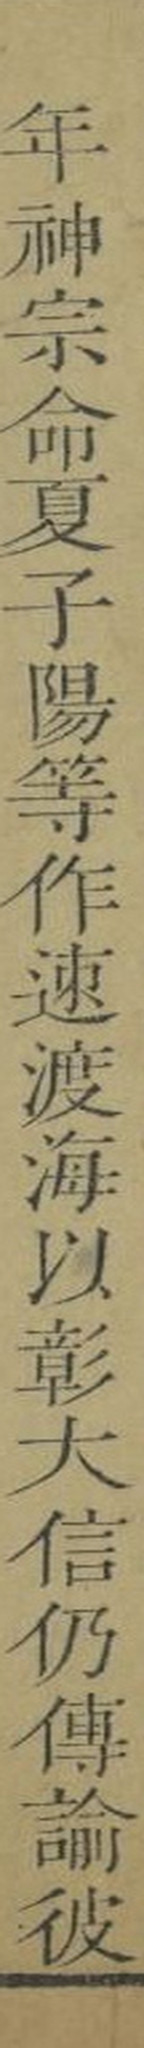年神宗命夏子陽等作速渡海以彰大信仍伝諭彼
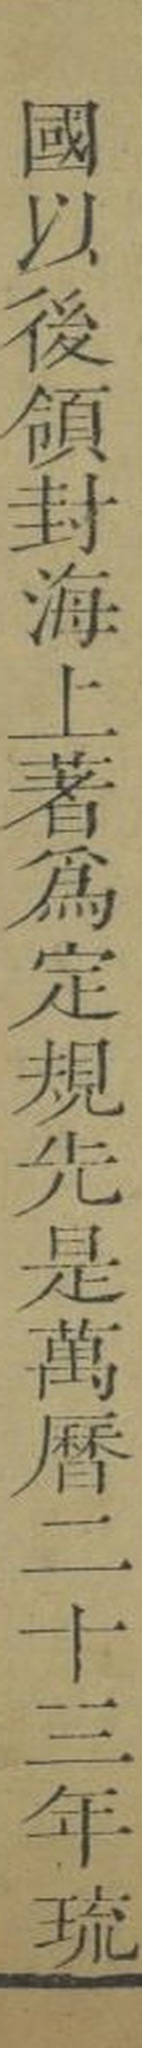国以後領封海上著為定規先是万暦二十三年琉
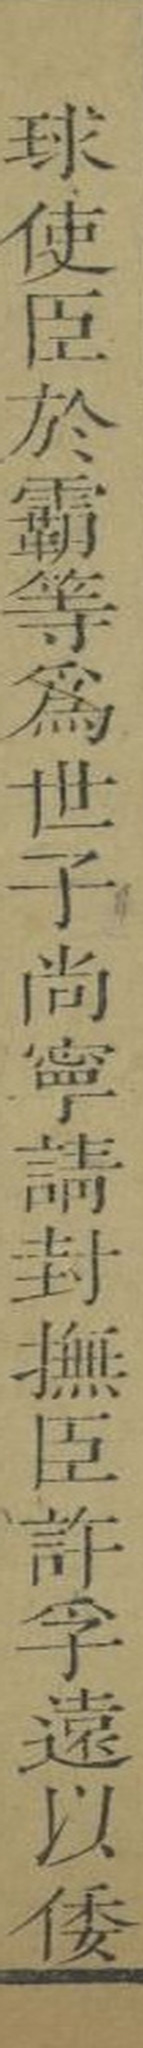球使臣於覇等為世子尚寧請封撫臣許孚遠以倭
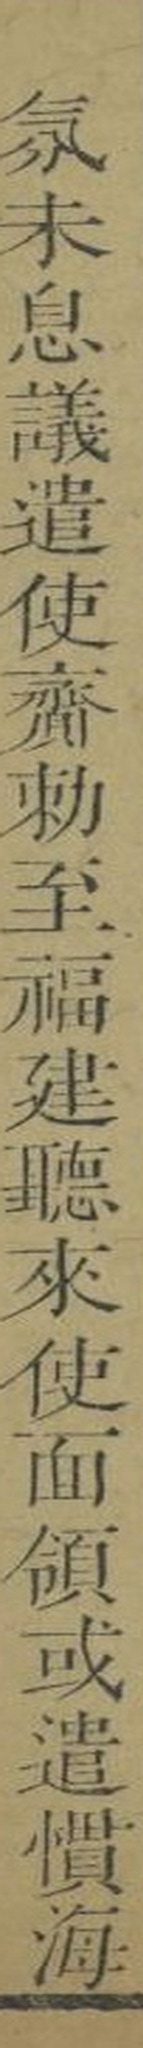氛未息議遣使齎勅至福建聴来使面領或遣慣海
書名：中山伝信録 巻四
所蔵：University of the Ryukyus Library
